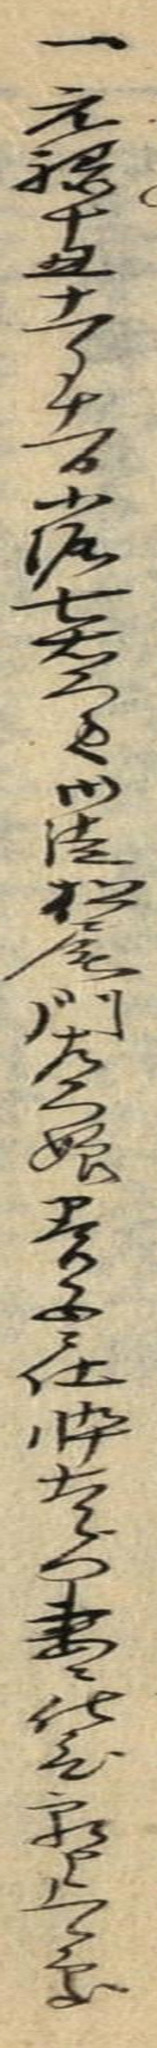一元禄十丑十一月十一日小堀七右衛門方へ御徒松尾門左衛門娘養子ニ仕倅太郎右衛門妻ニ仕度願申上候処
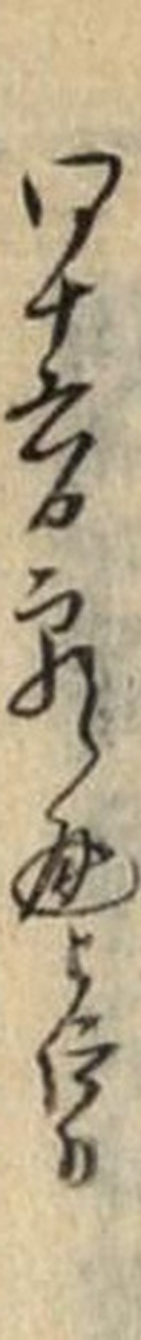同十六日願之通被仰付
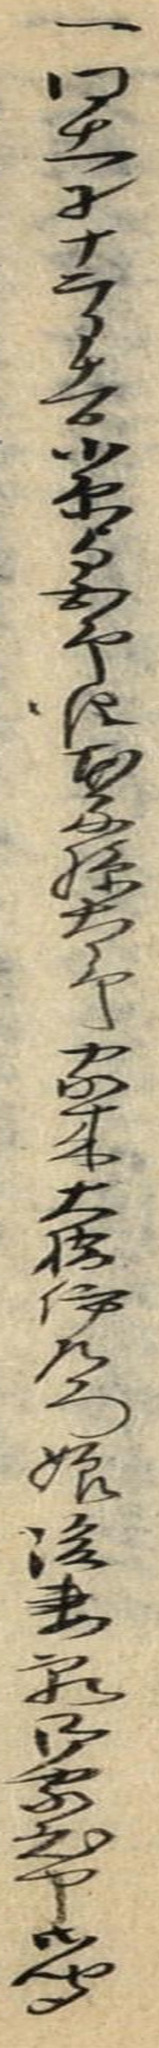一同十一刁十二月十一日小原与五郎儀本多孫太郎家来大橋伊左衛門娘後妻願御家老中御聞
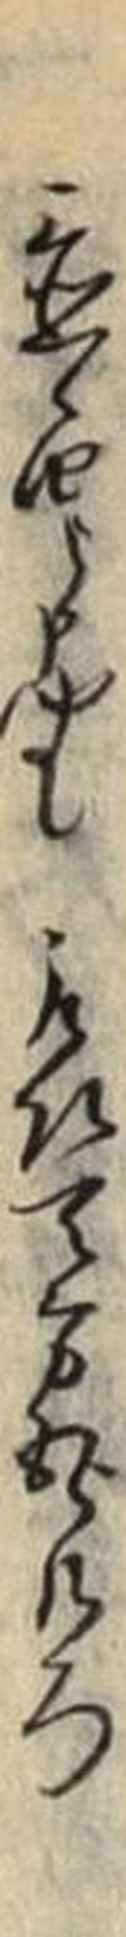置候由被申聞候取次天方五郎左衛門
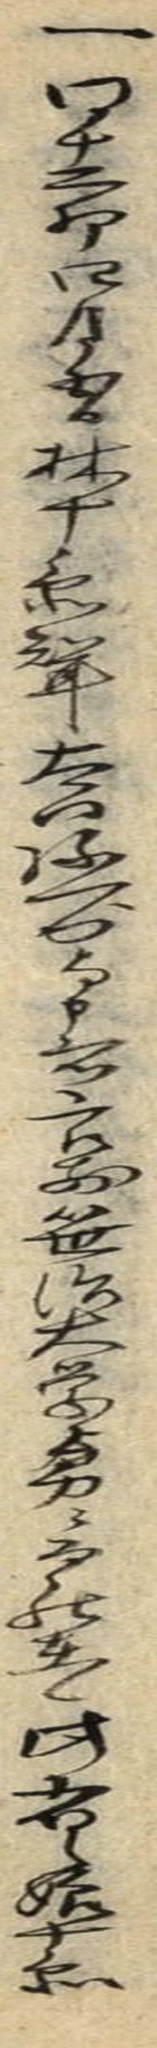一同十二卯四月五日林十兵衛聟太田弥一右衛門与申者最前笹治大学与力に而罷在候此者之娘十兵衛
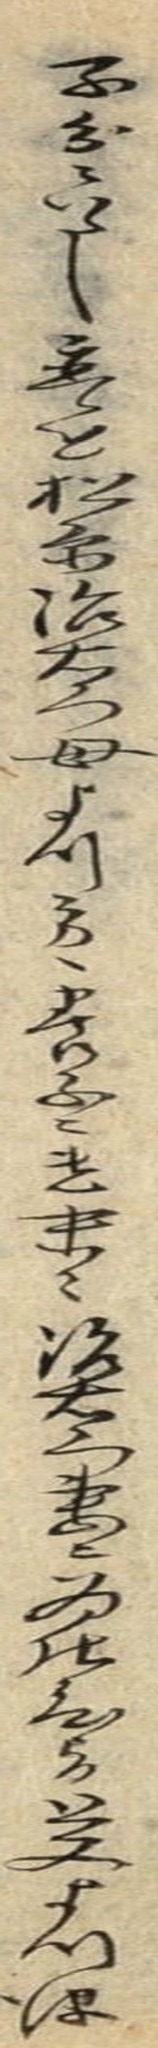子分ニいたし置候を松原治右衛門母よつ方へ養子ニ遣末々治右衛門妻ニ為仕度旨且又よつ儀
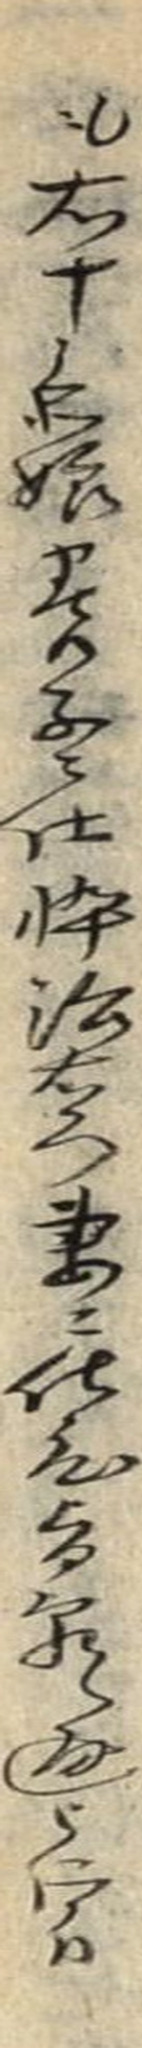も右十兵衛娘養子ニ仕倅治右衛門妻ニ仕度旨願之通被仰付
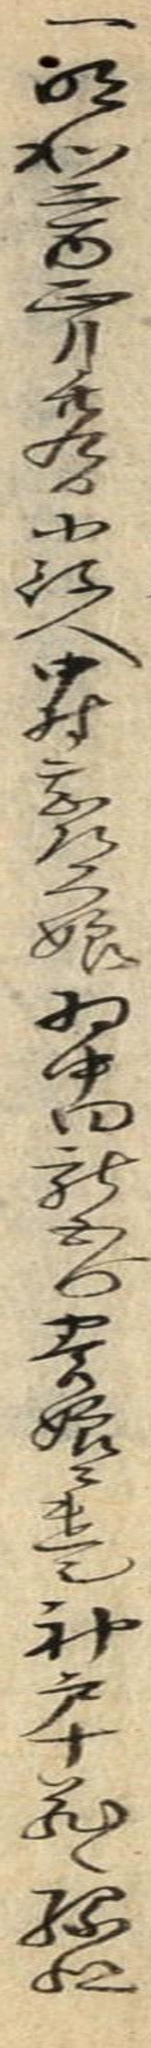一明和ニ酉正月廿九日小役人中村甚左衛門娘為中田新五右衛門養娘ニ遣シ神戸十蔵へ縁組

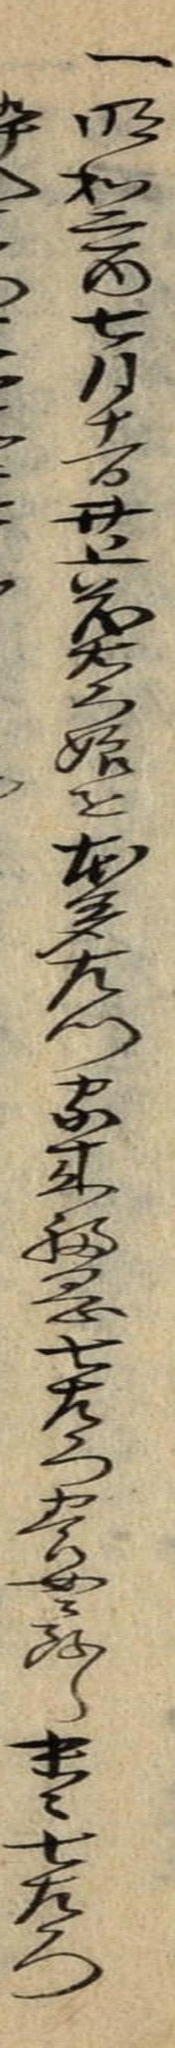一明和二酉七月十一日井上茂右衛門娘を本多左門家来福岡七左衛門養女ニ致し末々七左衛門
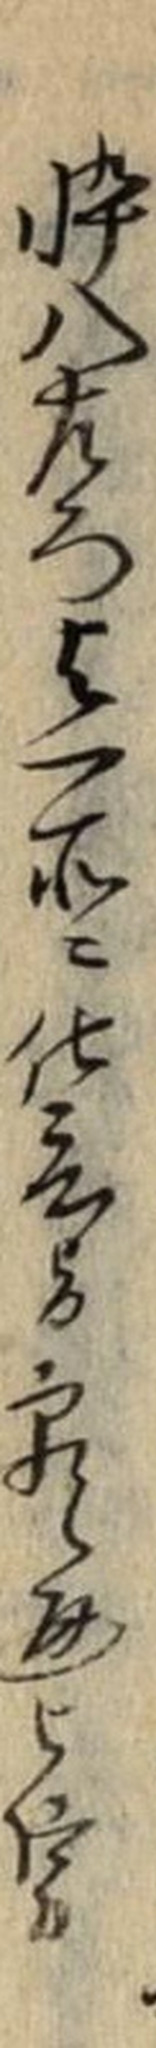忰八左衛門与一所ニ仕度旨願之通被仰付
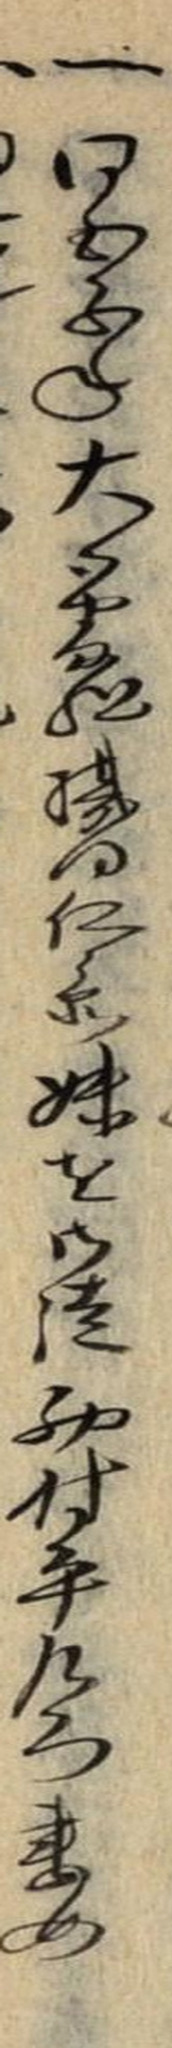一同五子年大御番組磯田仁兵衛妹を御徒西村平左衛門妻女
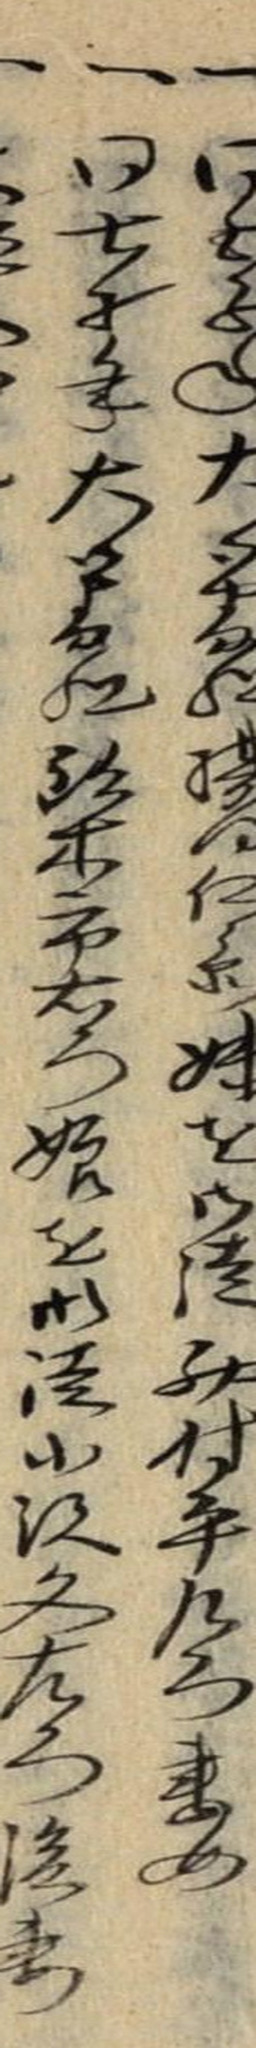一同七寅年大御番組鈴木市右衛門娘を御徒小沢文左衛門後妻
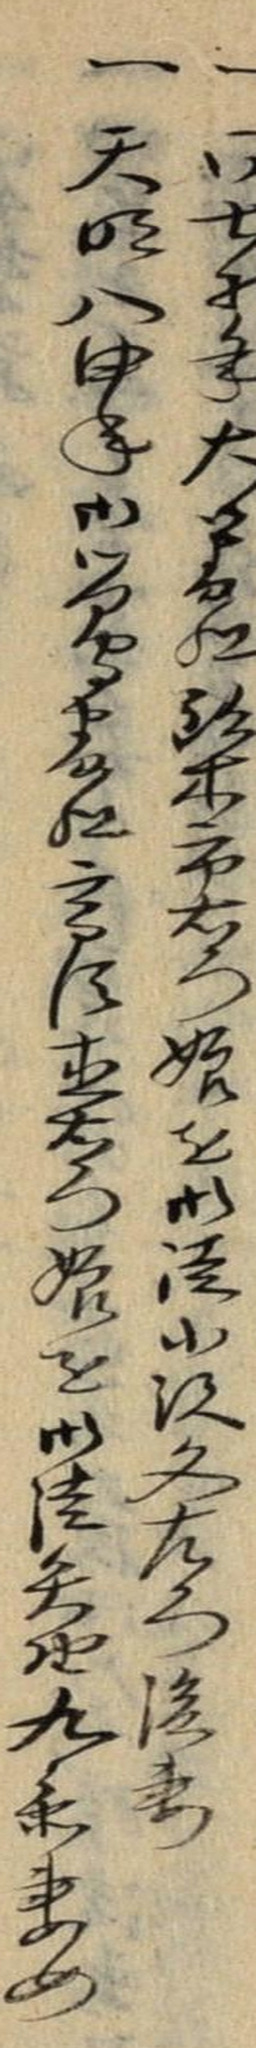一天明八申年御留守番組高須直右衛門娘を御徒矢野九兵衛妻女
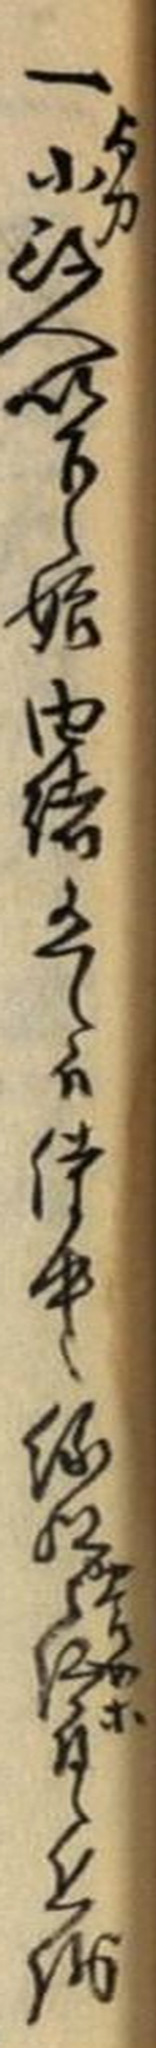一与力小役人以下之娘由緒有之ニ付侍中へ縁組養女等被仰付候近例
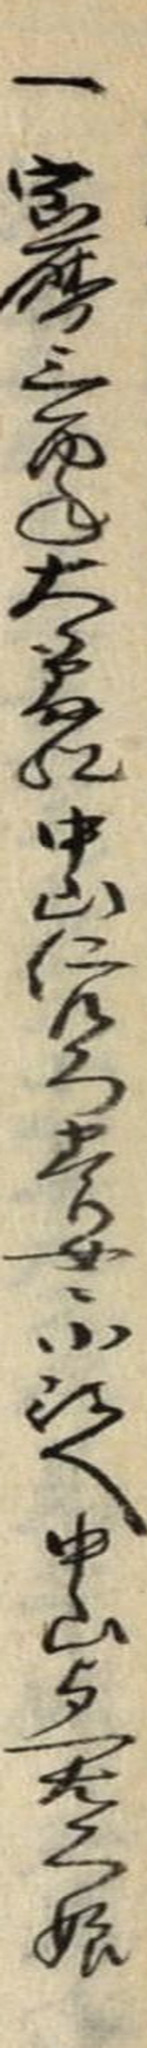一宝暦三酉年大御番組中山仁左衛門養女ニ小役人中山与一左衛門娘
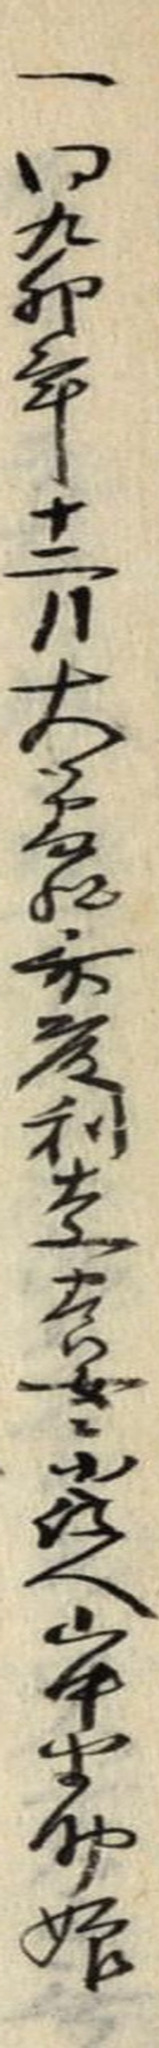一同九卯年十二月大御番組斎藤利太夫養女ニ小役人山中半助娘
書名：養子縁組之部
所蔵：福井県文書館 Fukui Prefectural Archives
